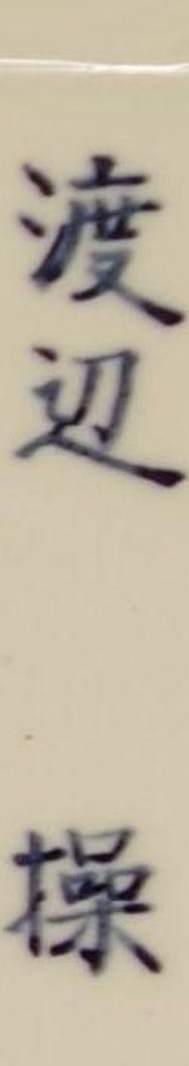渡辺操
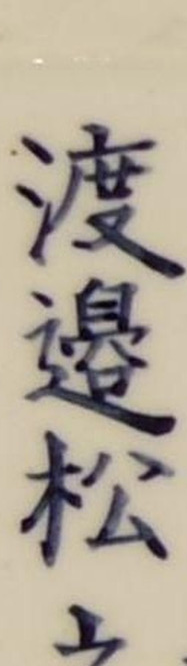渡辺操
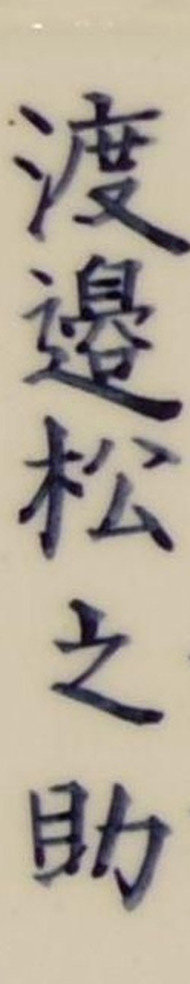渡邉松之助
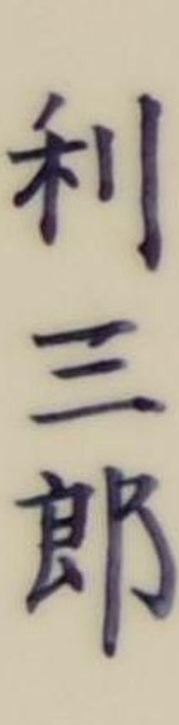利三郎
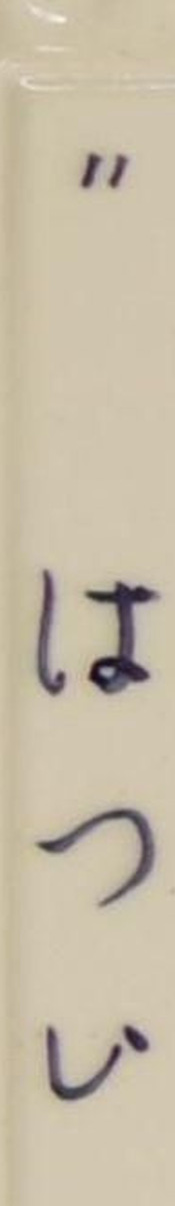はつい
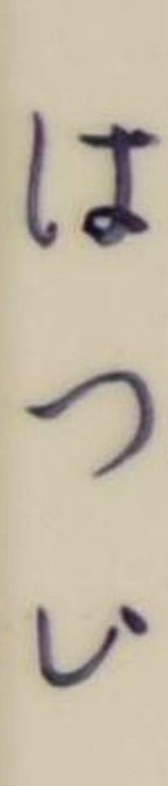はつい

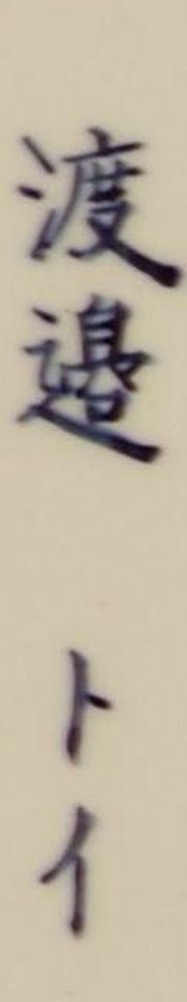渡邉トイ
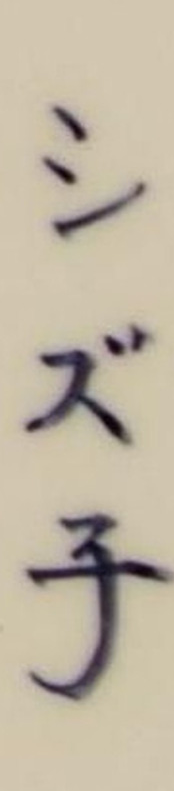シズ子
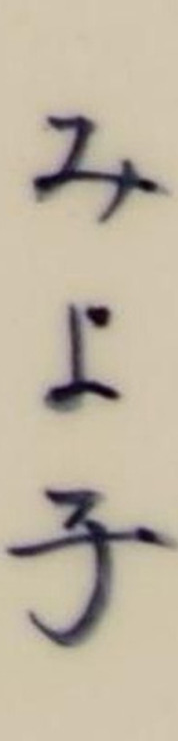みよ子
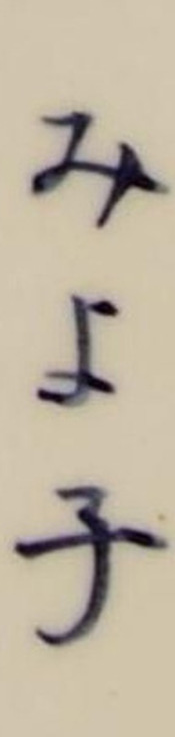みよ子
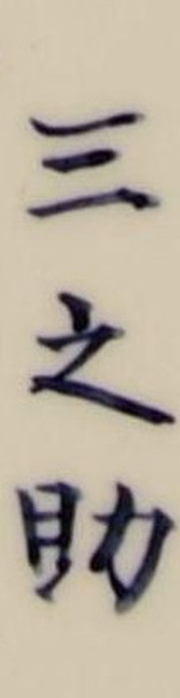三之助
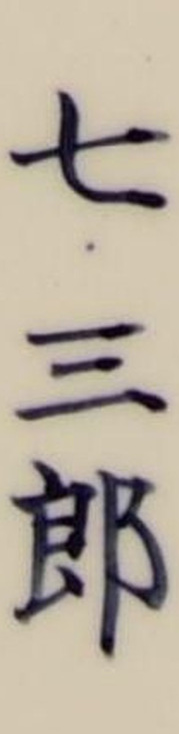七三郎
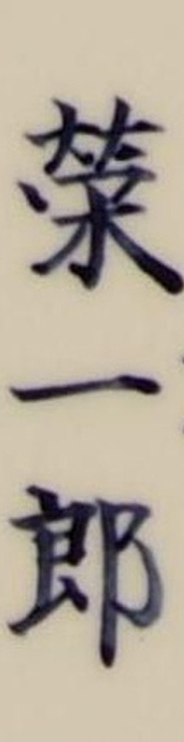榮一郎
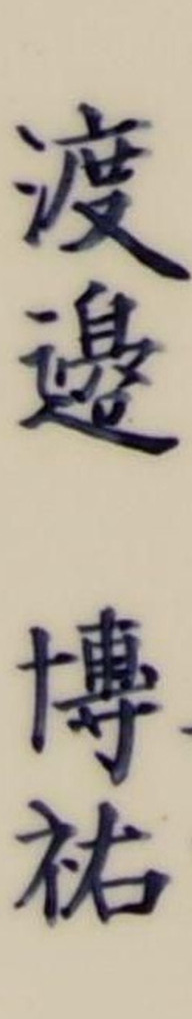渡邉博祐
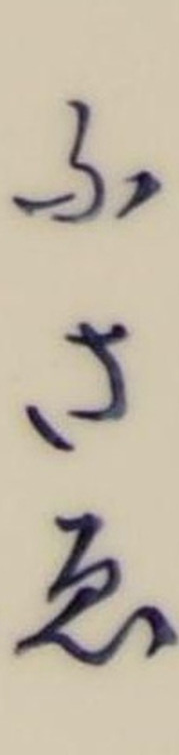ふさゑ
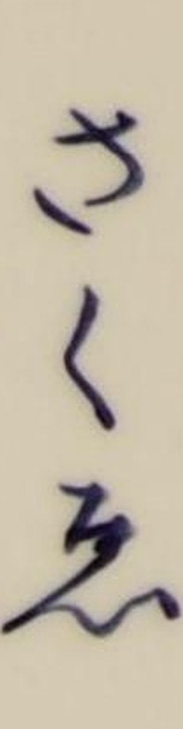さくゑ
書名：A~D
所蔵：koyasan kongobuji
